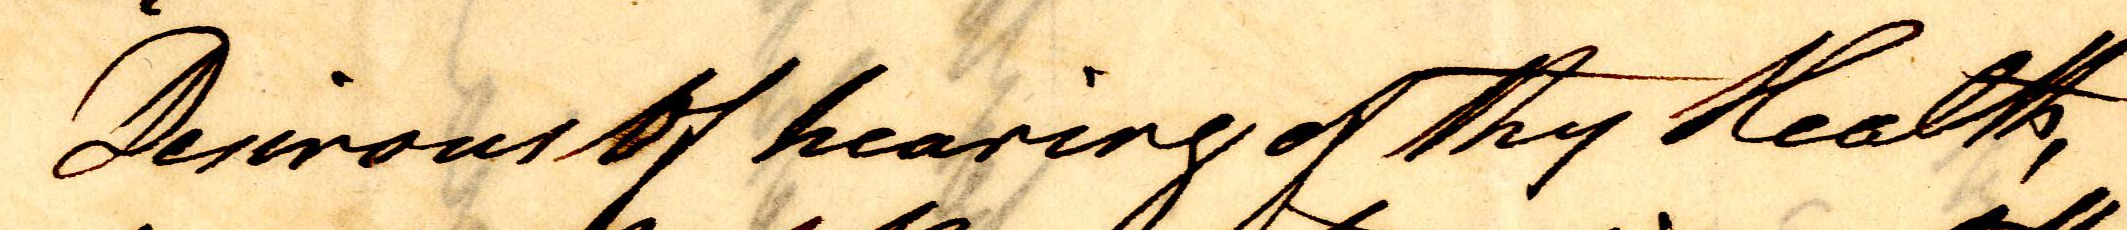Desirous of hearing of thy Health,
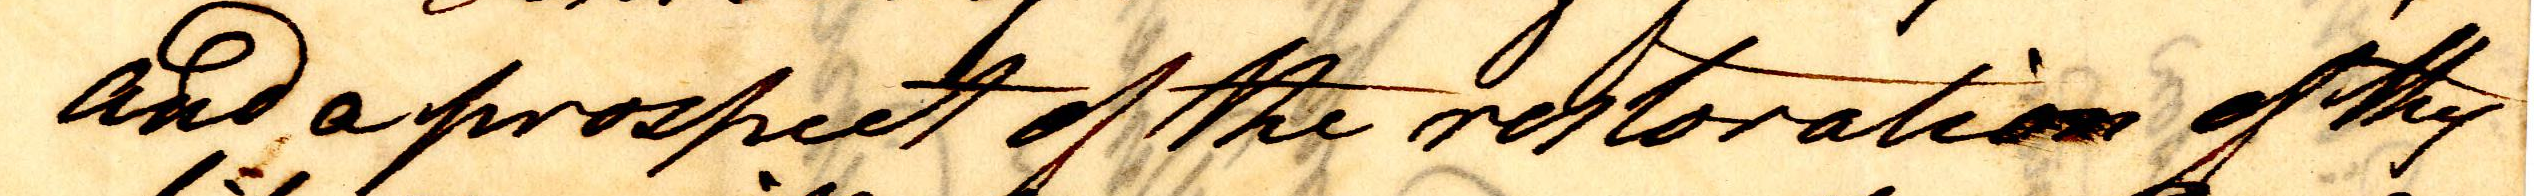and a prospect of the restoration of thy
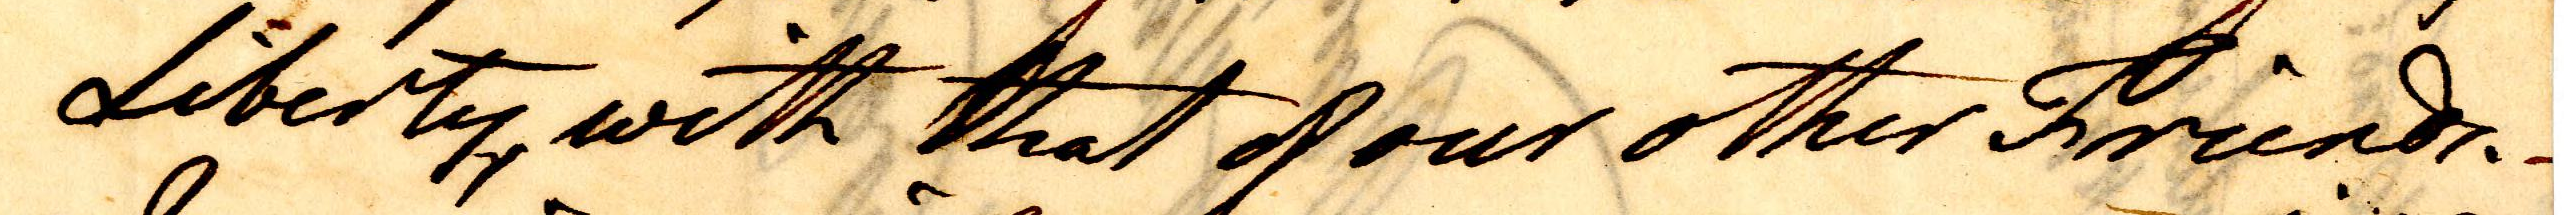Liberty, with that of our other Friends.
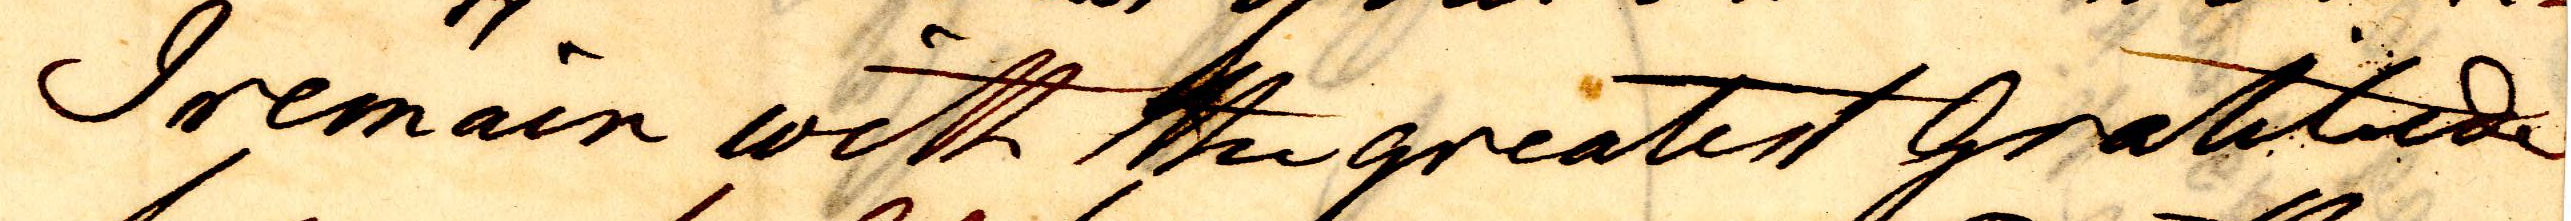I remain with the greatest gratitude
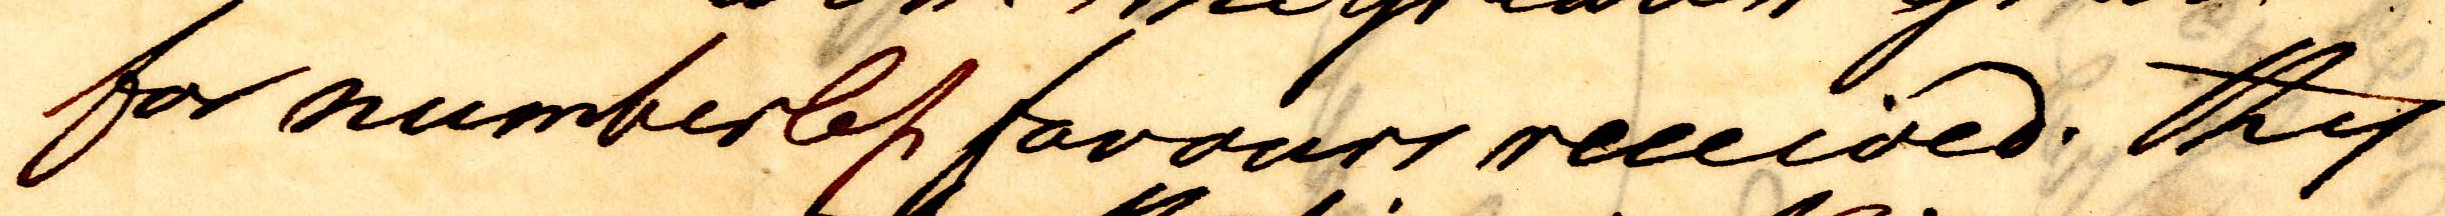for numberless favours received. thy
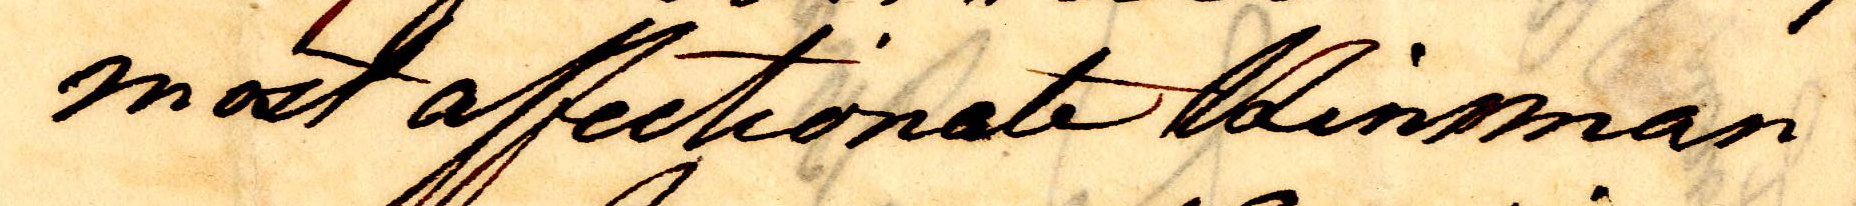most affectionate Kinsman
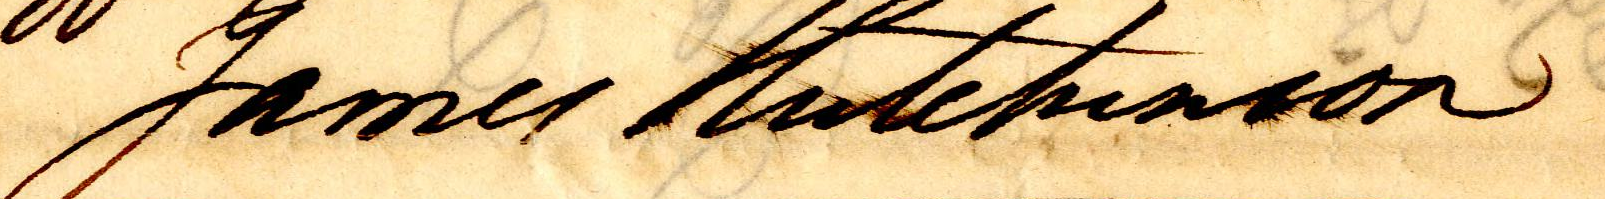James Hutchinson
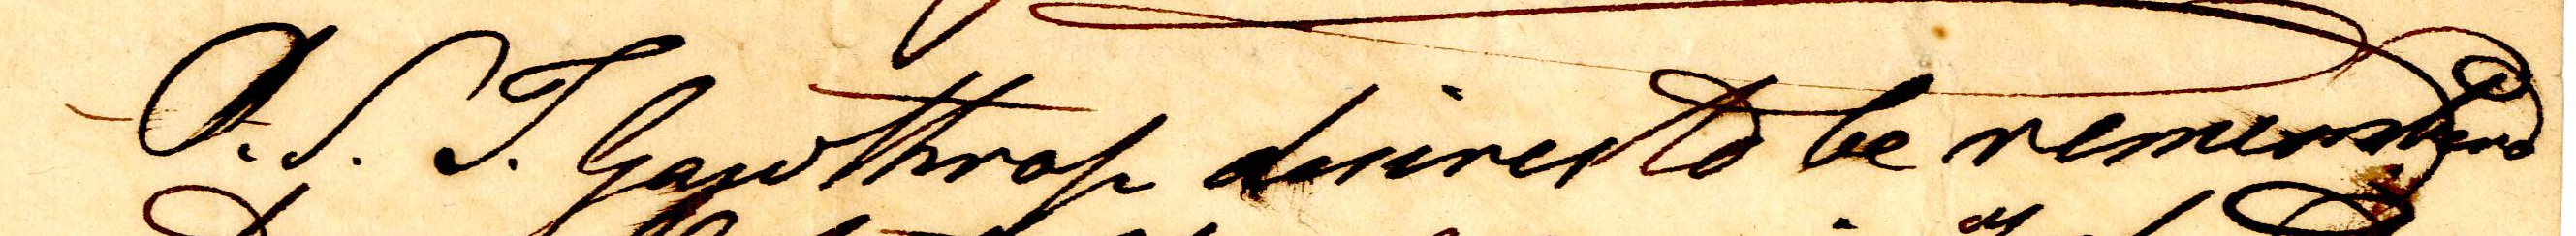P.S. T. Gawthrop desires to be remembered
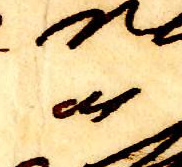us
